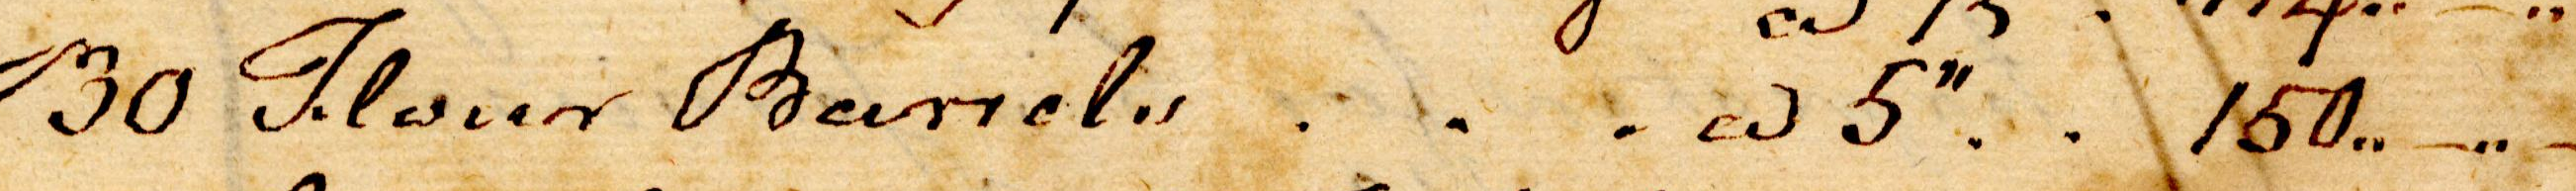30 Flour Barrels. . . at 5" . .150...-
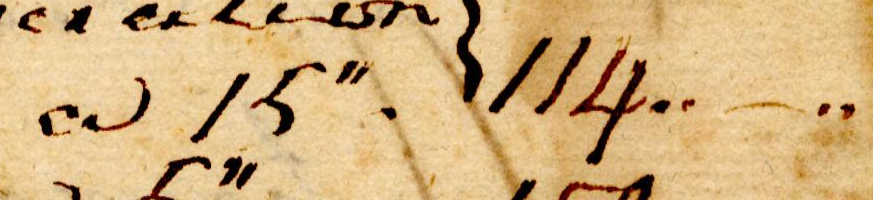at 15". 114.-
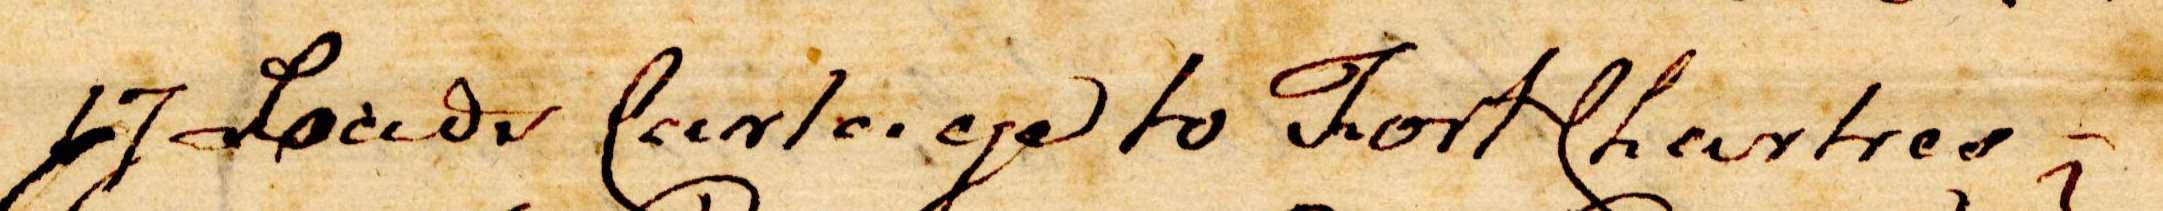17 Loads Cariage to For Chertres-
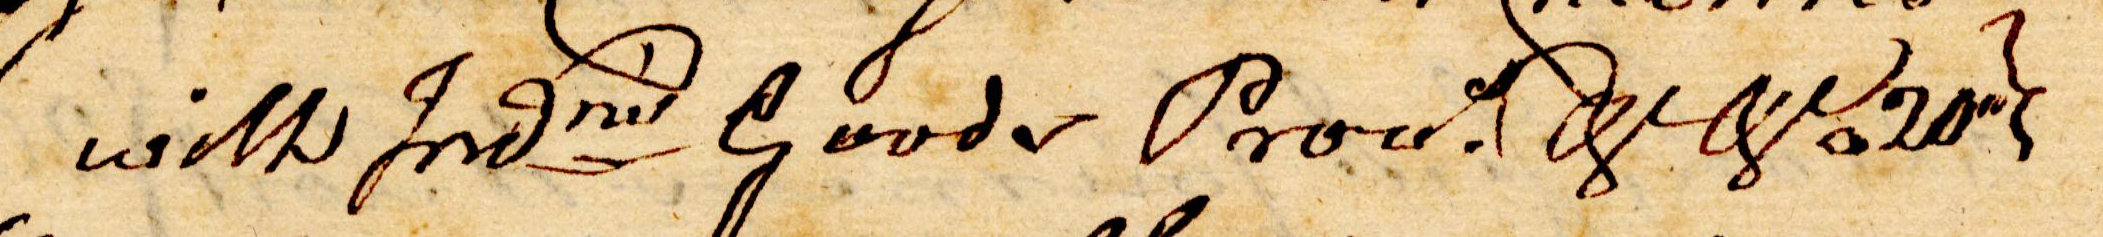with Ind^ns Goods Prov^d &c &c @ 20"
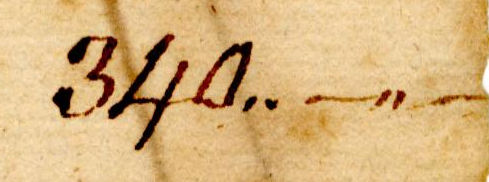340.-.-
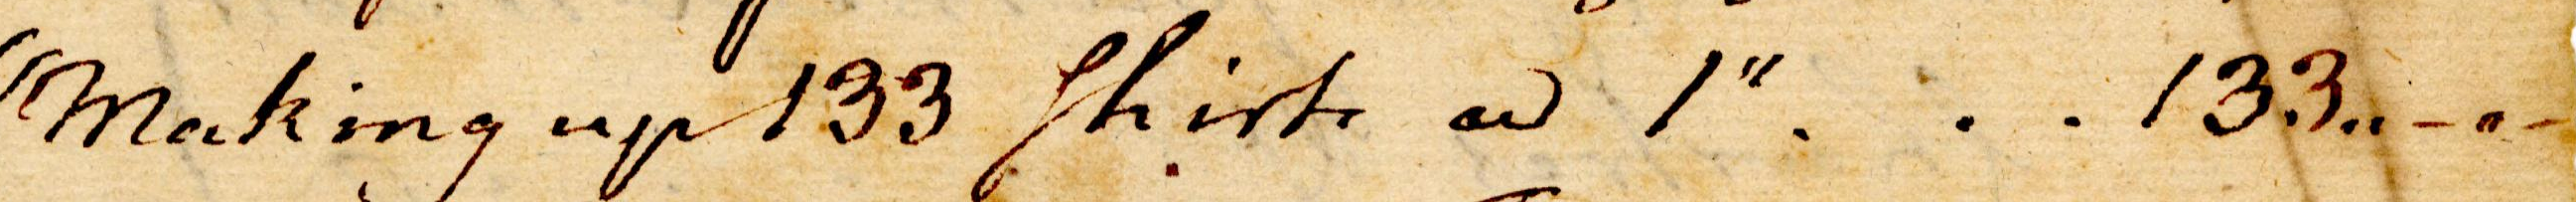Making up 133 shirts at 1"... 133.-.-
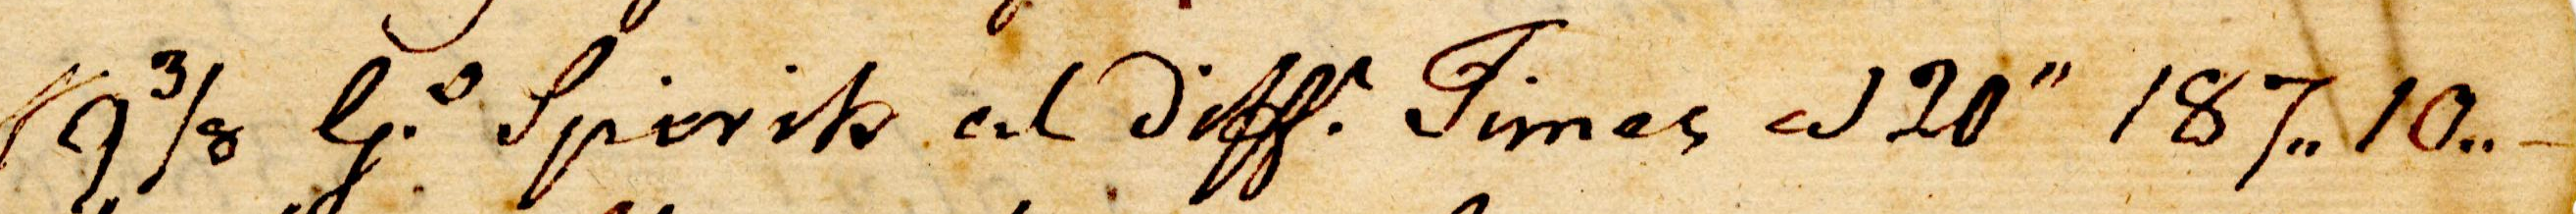9 3/8 G^o. spirits at diff^t times @ 20" 187.10.-
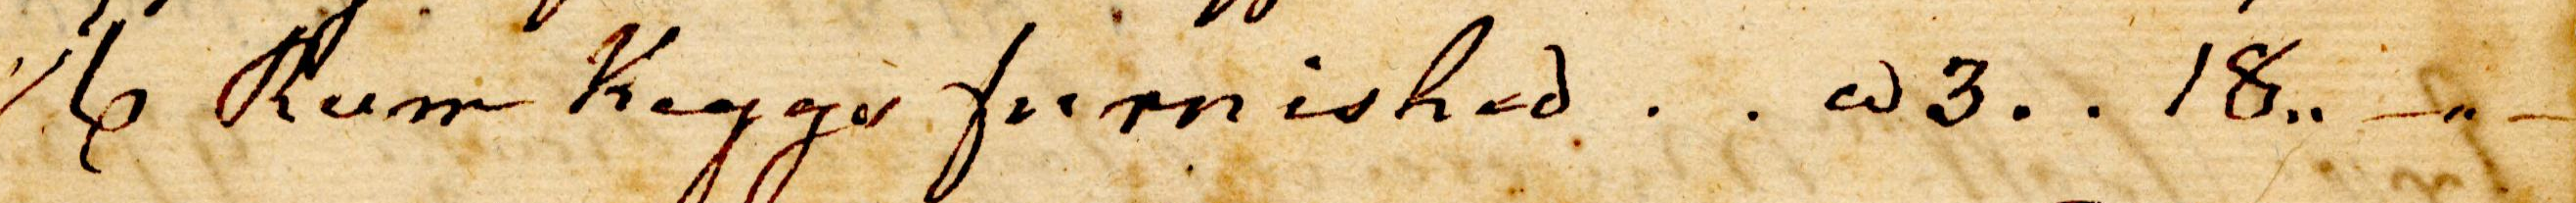6 Rum Keggs furnished.. @ 3.. 18.-.-
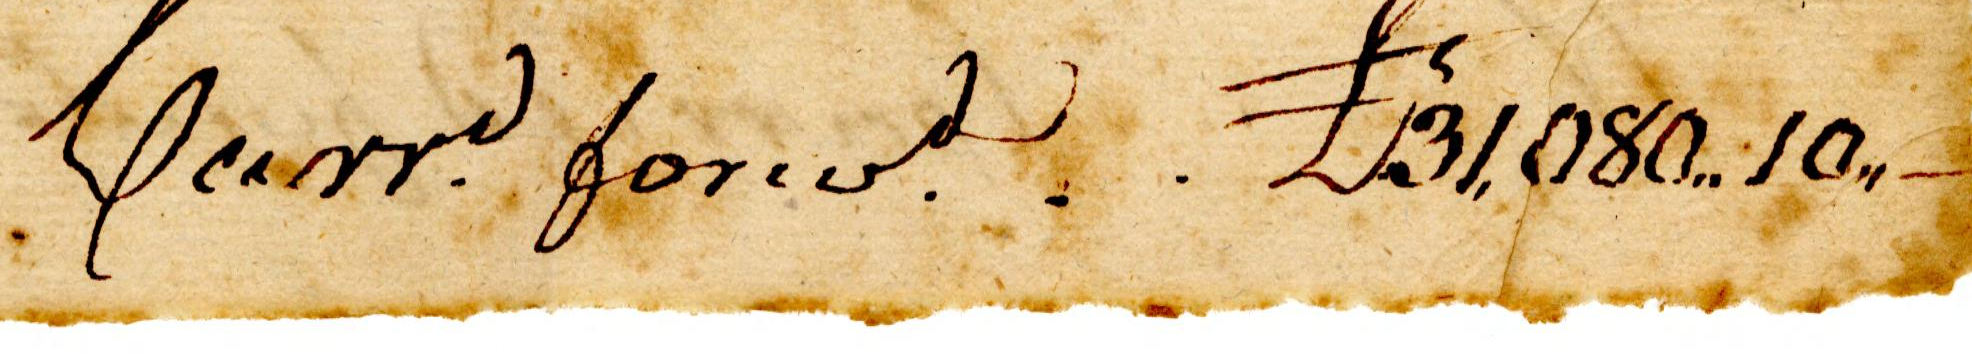Carr^d. forw^d... £31,080..10..-
